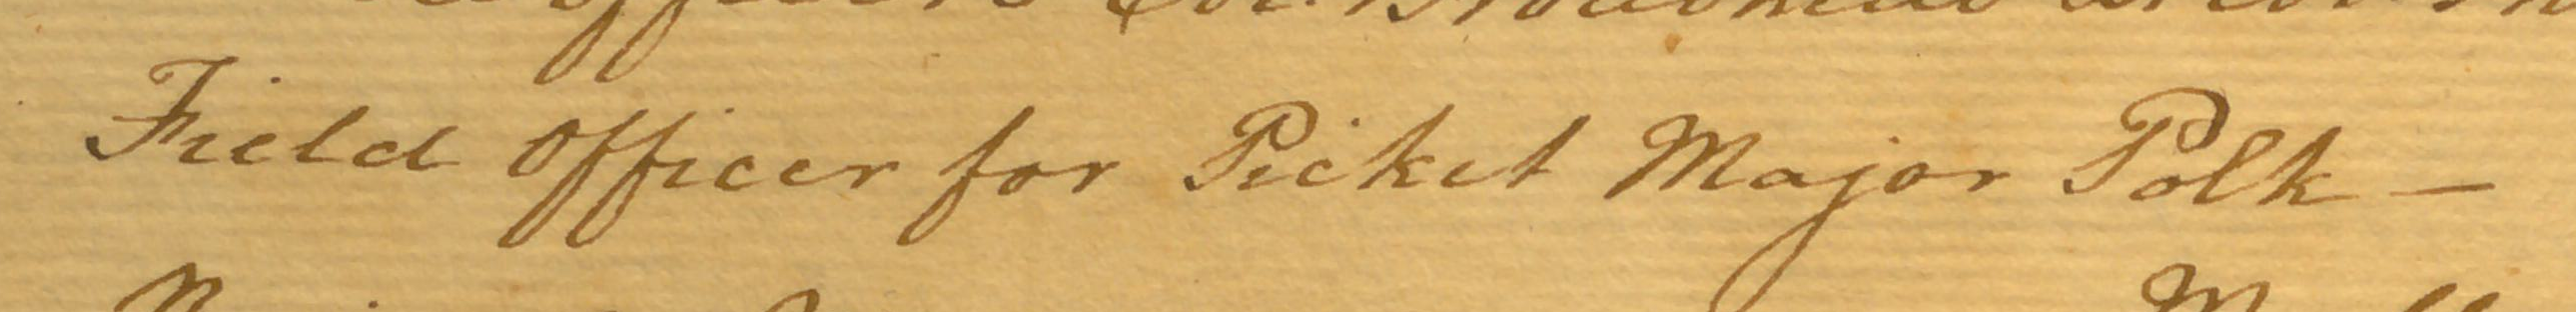Field officer for Picket Major Polk-
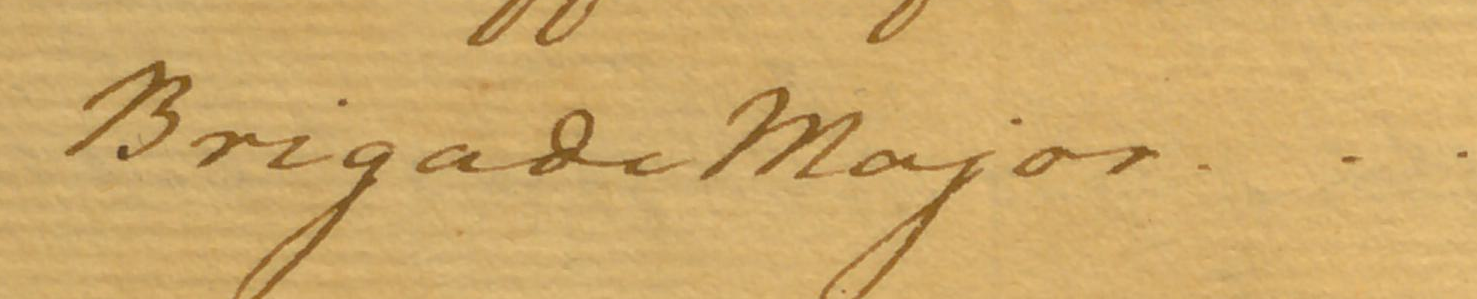Brigade Major...
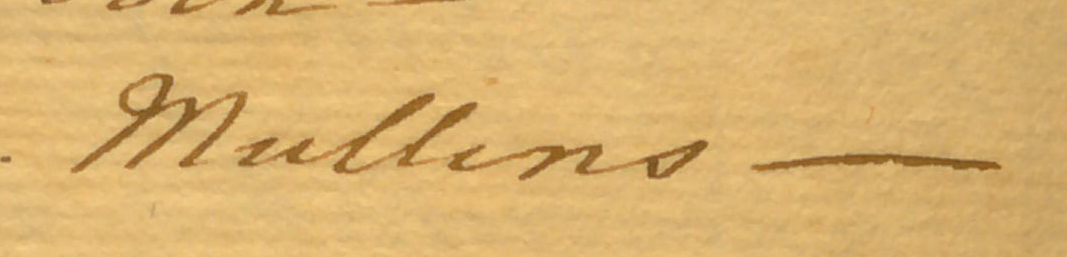Mullins-
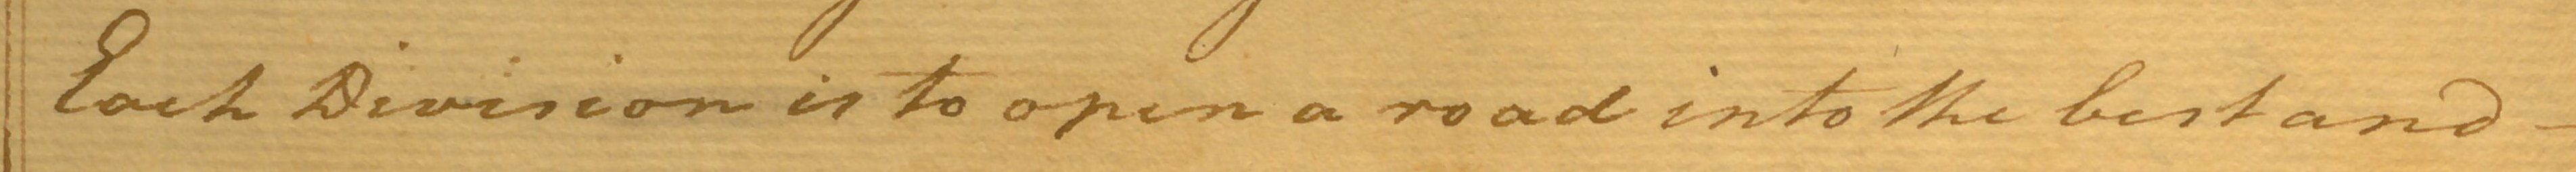Each Division is to open a road into the best and
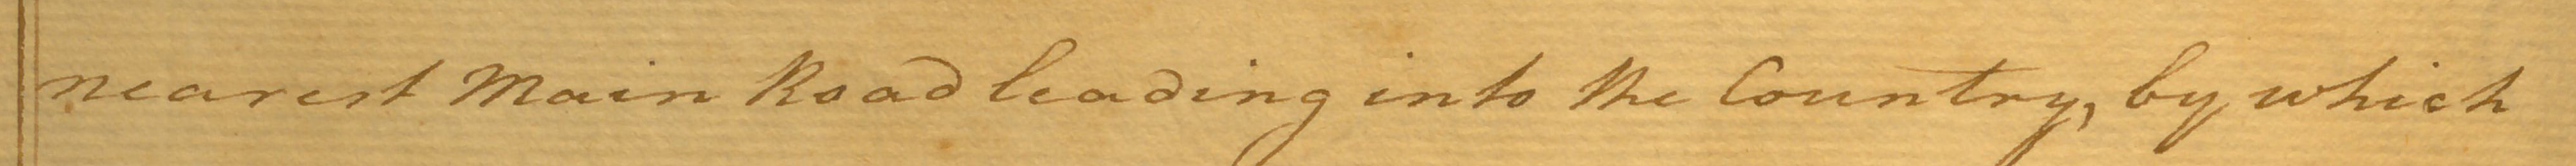nearest main Road leading into the Country, by which
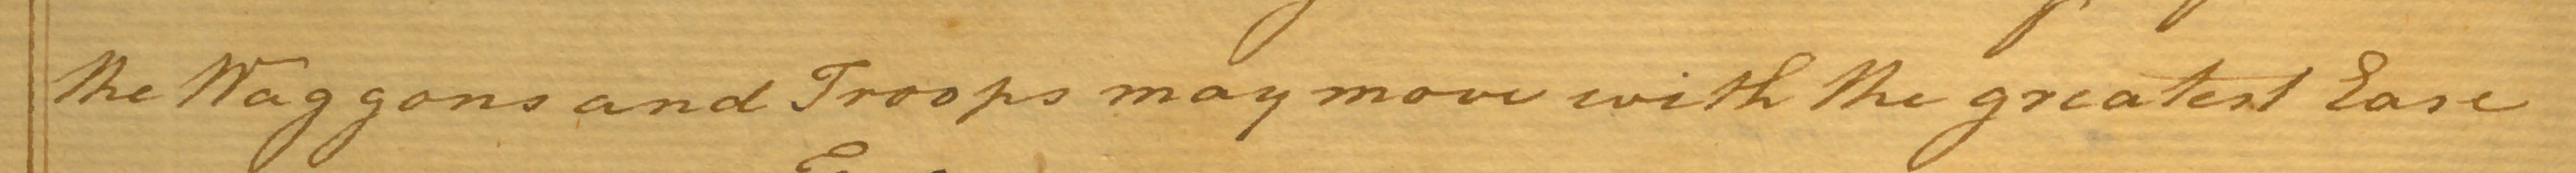the Waggons and Troops may move with the greatest Ease
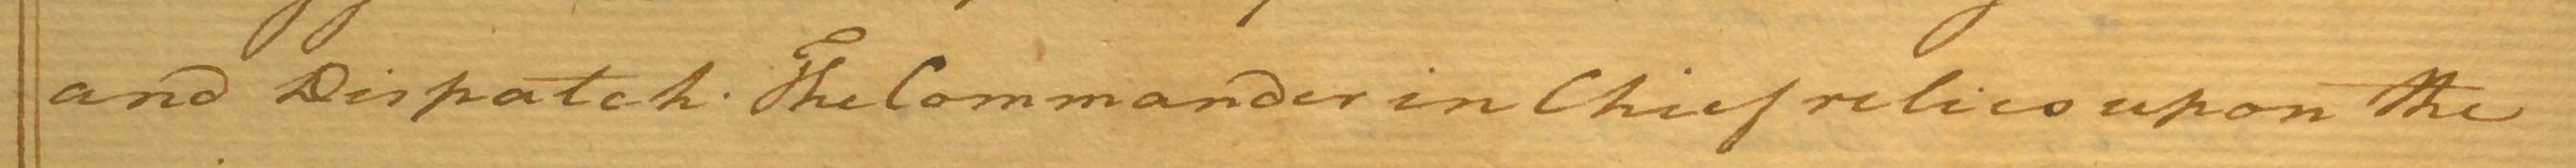and Dispatch. The Commander in Chief relies upon the
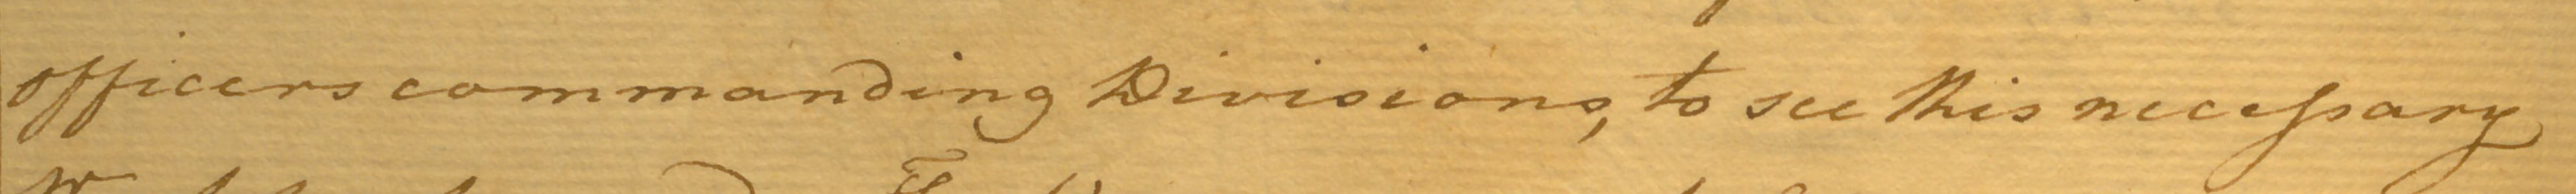officers commanding Divisions, to see this necessary
